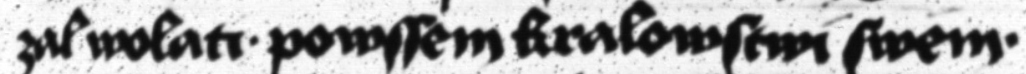zal wolati. powſſem kralowſtwí ſwém.
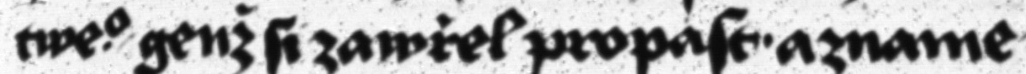twe°. genž ſi zawřel propaſt. a zname
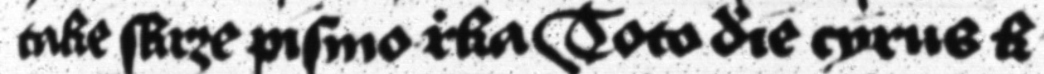take ſkrze píſmo ṙṙka Toto ḋíe cýrus k
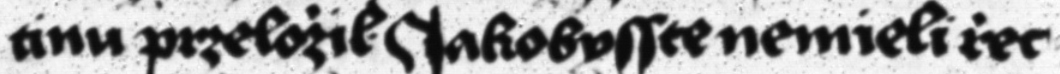tinu przelożil Iakobyſſte nemieli ṙec
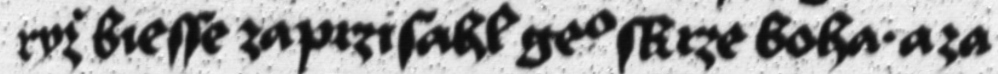ryž bíeſſe zaprzisahl ge° ſkrze boha. a za
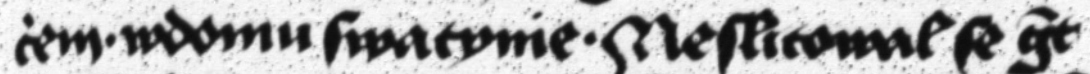ċem. wdomu ſwatynie. Neſlitowal ſe ḡt
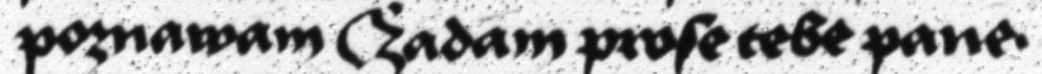poznawam Żadam proſe tebe pane.
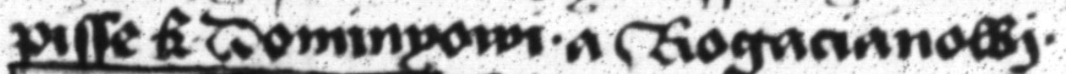píſſe k Dominyowi. a Rogaciánowi.
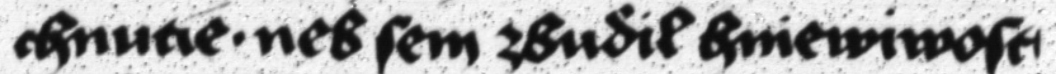chnutíe. neb ſem zbuḋil hniewiwoſt
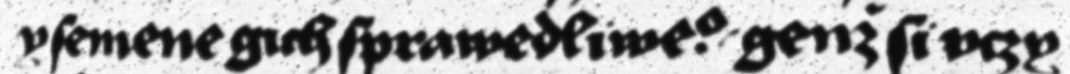yſemene gich ſprawedliwe°, genž ſi vczy
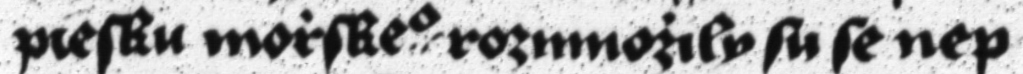píeſku moṙſke° rozmnožily ſu ſe nep
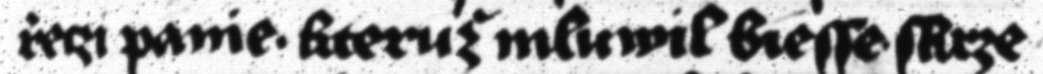ṙeczi panie. kteruž mluwil bíeſſe skrze
